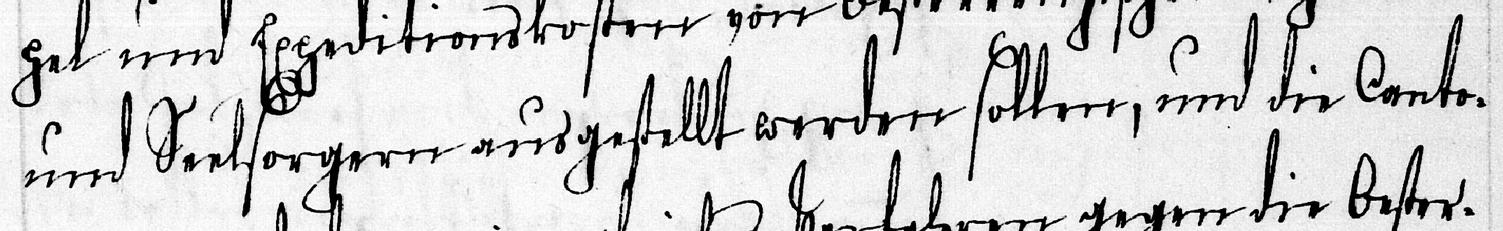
und Seelsorgern ausgestellt werden sollen, und die Canto¬
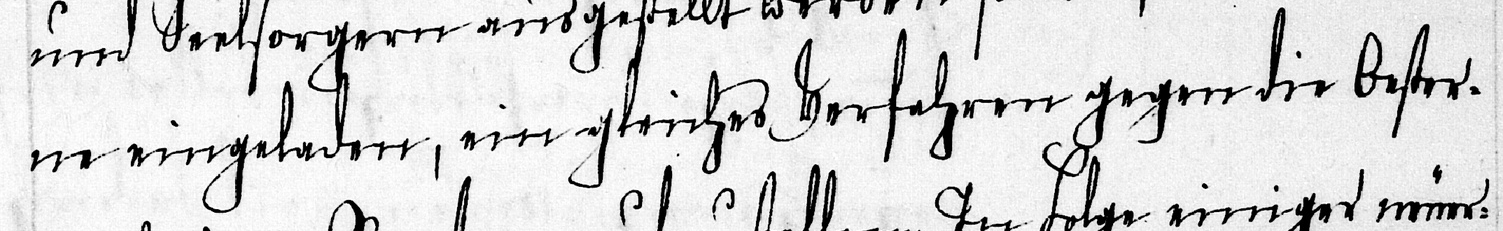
ne eingeladen, ein gleiches Verfahren gegen die Oester¬
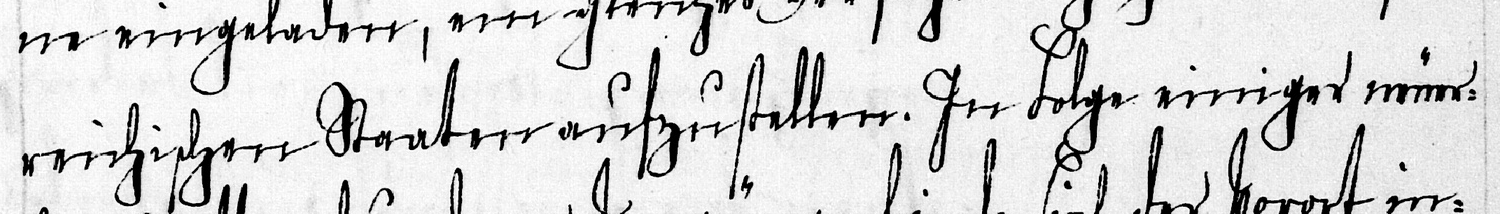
reichischen Staaten aufzustellen. In Folge einiger neuer¬
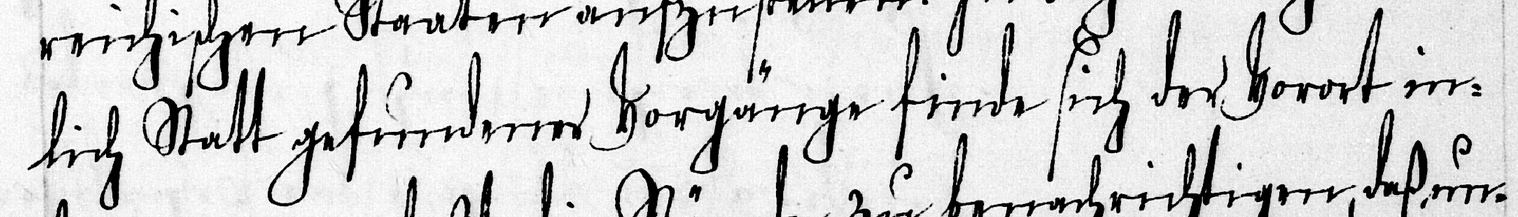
lich Statt gefundener Vorgänge finde sich der Vorort in¬
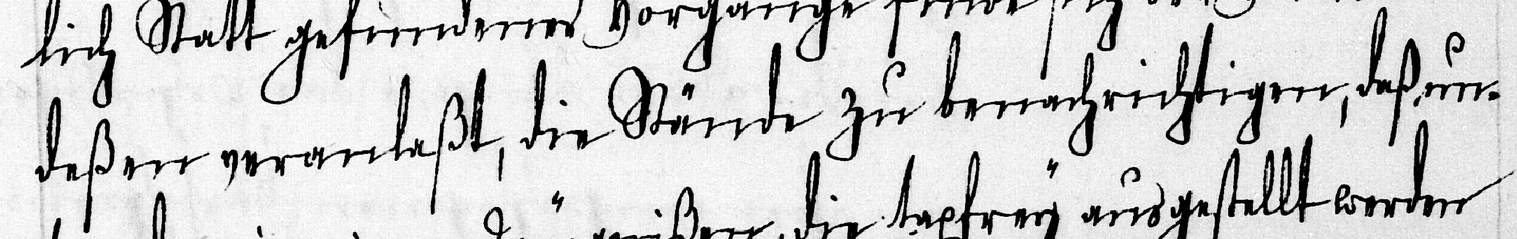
deßen veranlaßt, die Stände zu benachrichtigen, daß un¬
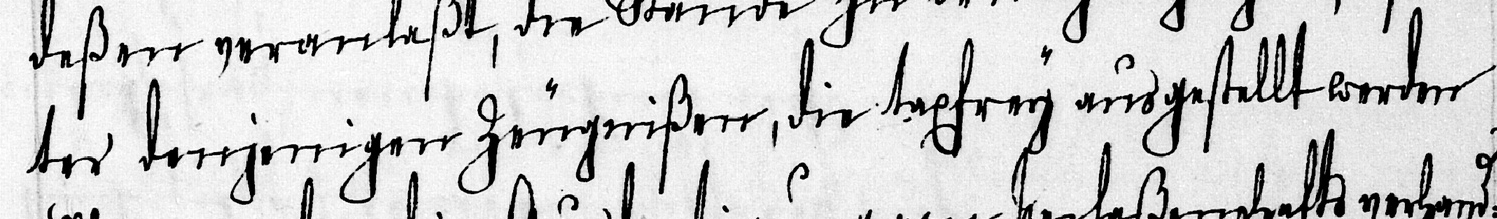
ter denjenigen Zeugnißen, die taxfrey ausgestellt werden
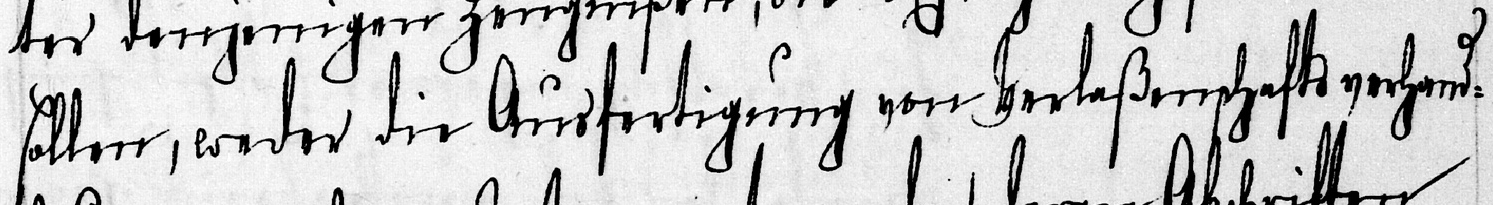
sollen, weder die Ausfertigung von Verlaßenschaftsverhan¬
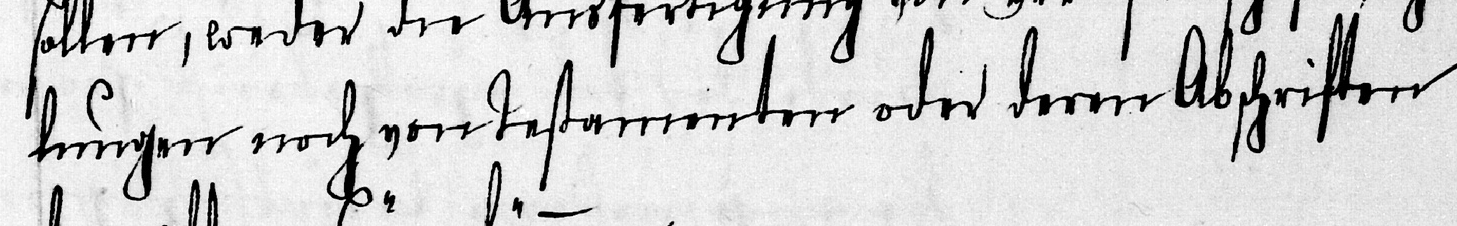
dlungen noch Testamenten oder deren Abschriften
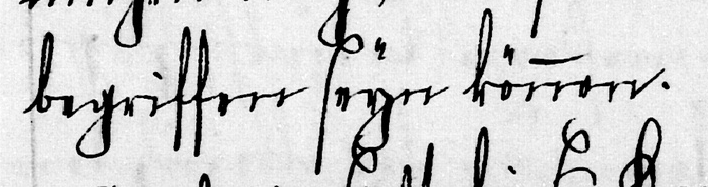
begriffen seyn können.
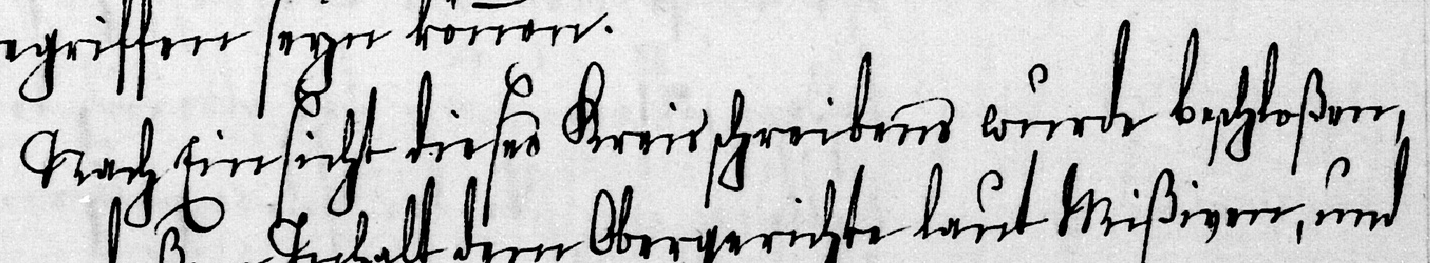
Nach Einsicht dieses Kreisschreibens wurde beschloßen,
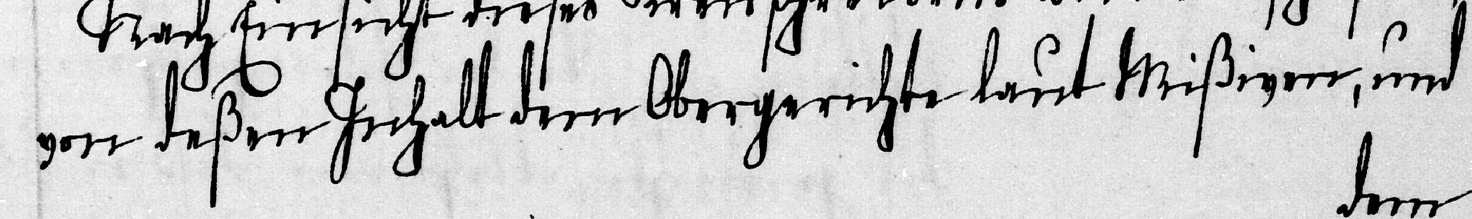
von deßen Inhalt dem Obergerichte lauf Mißiven, und
